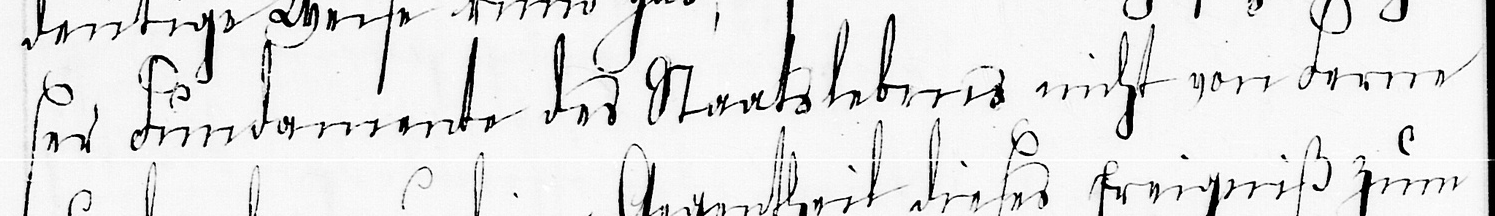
eser Fundamente des Staatslebens nicht von Ferne
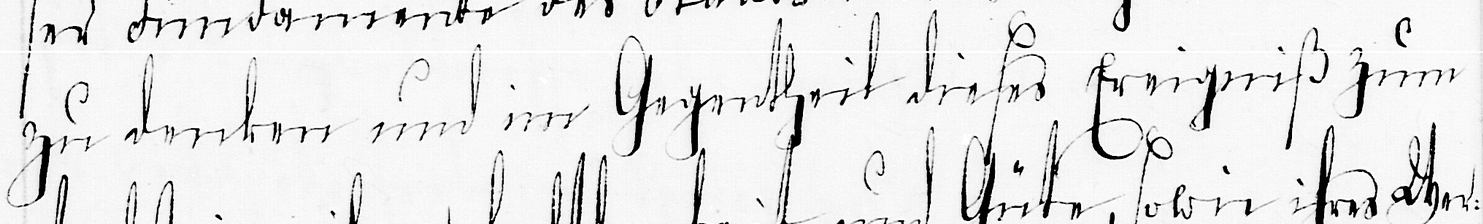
zu denken und im Gegentheil dieses Ereigniß zum
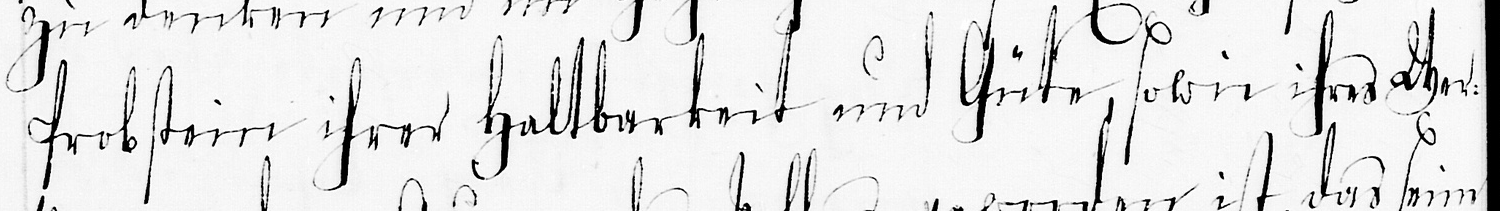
Probstein ihrer Haltbarkeit und Güte, sowie ihres We¬
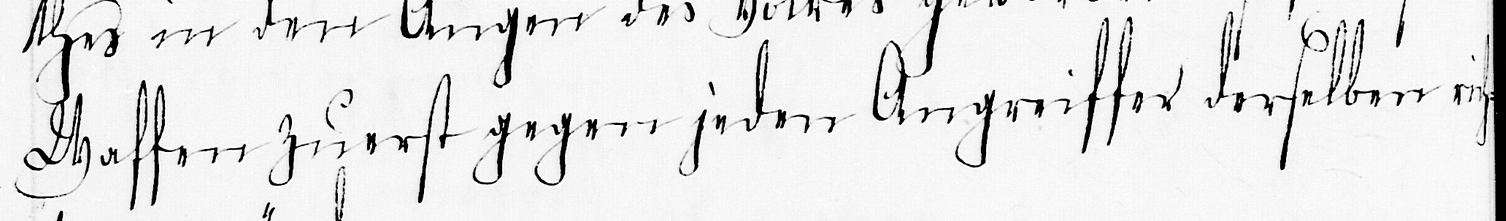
Waffen zuerst gegen jeden Angreiffer derselben ri¬
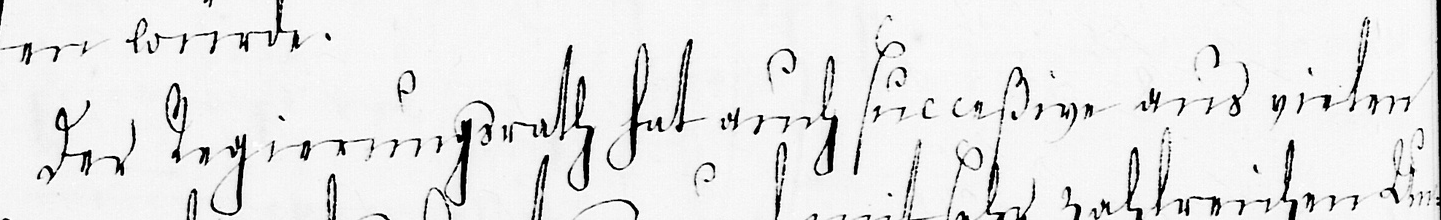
Der Regierungsrath hat auch succeßive aus vielen
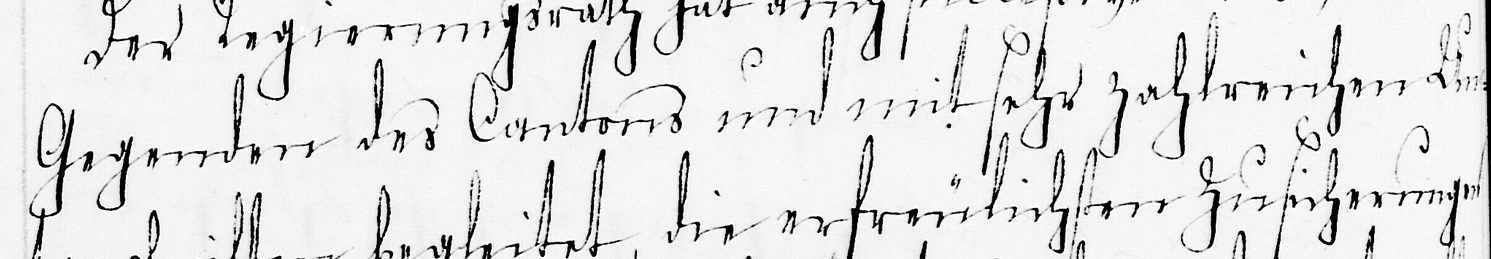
Gegenden des Cantons und mit sehr zahlreichen Un¬
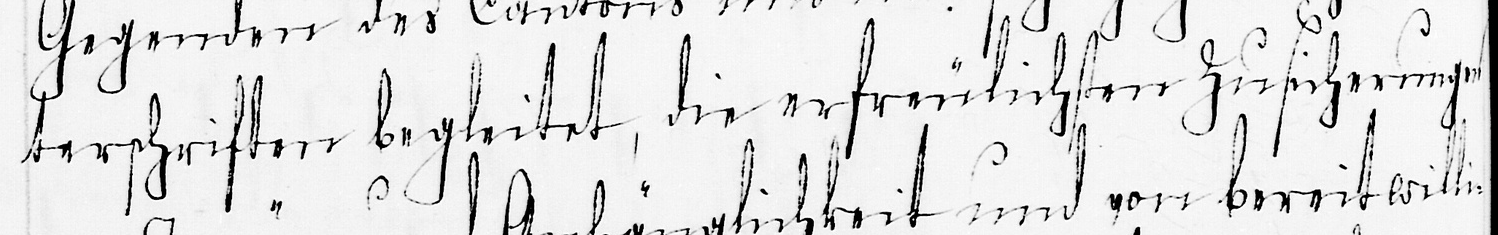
terschriften begleitet, die erfreulichsten Zusicherung¬
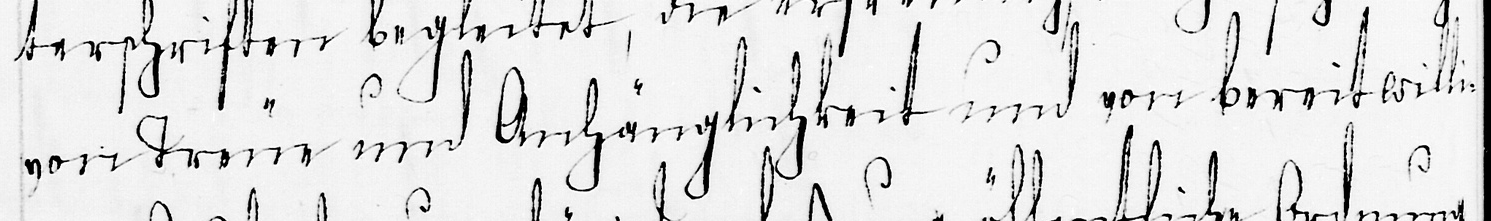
von Treue und Anhänglichkeit und von bereitwill¬
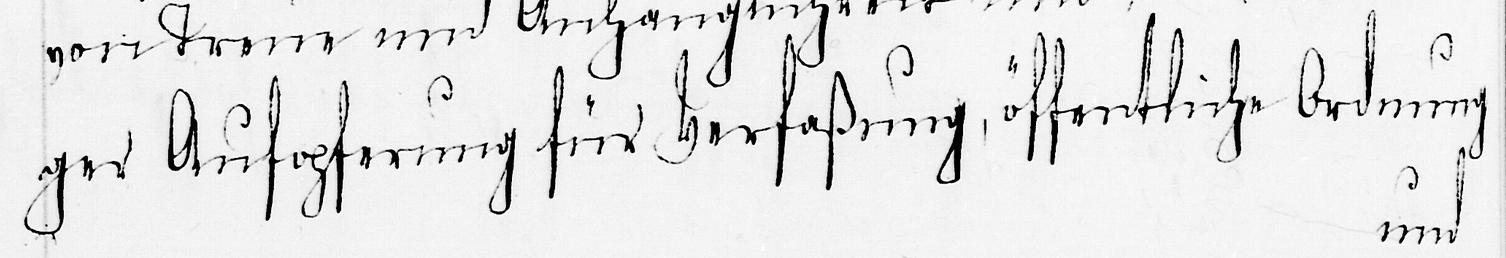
iger Aufopferung für Verfaßung, öffentliche Ordnung
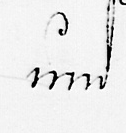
en
